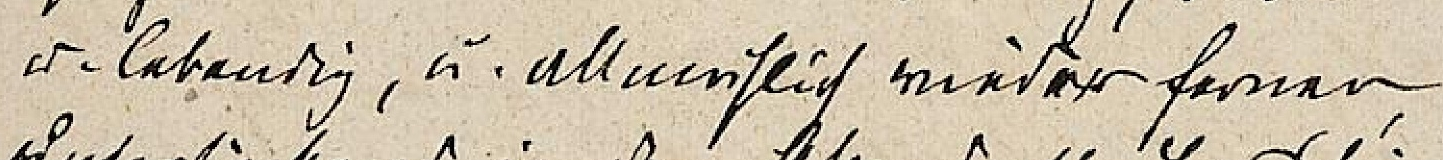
u. lebendig, u. allmöhlich wieder ferner,
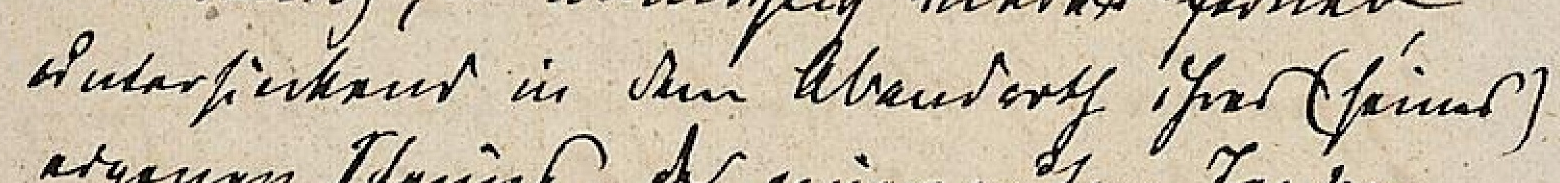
untersinkend in dem Abendroth ihres (seines)
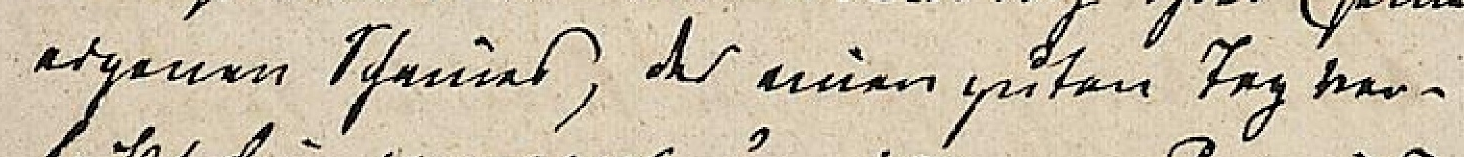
eigenen Scheines, das einen guten Teg ver¬
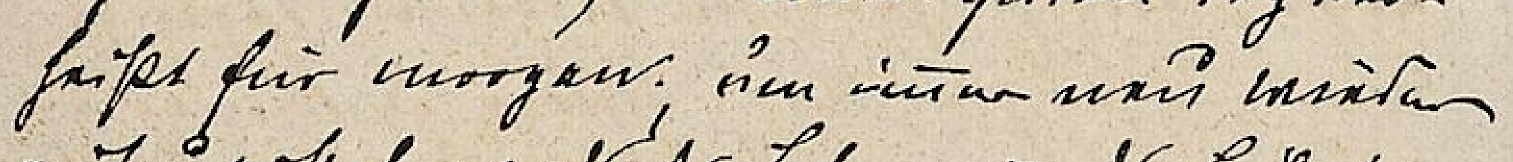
heißt für morgen. um imr neu wieder
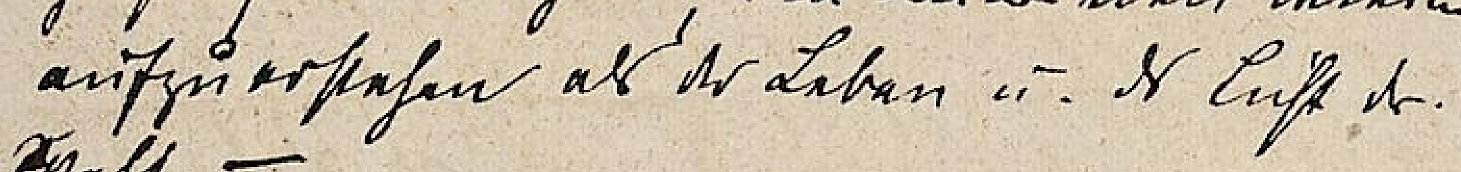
aufzuerstehen als das Leben u. ds Licht dr
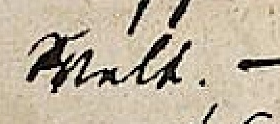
Welt. _
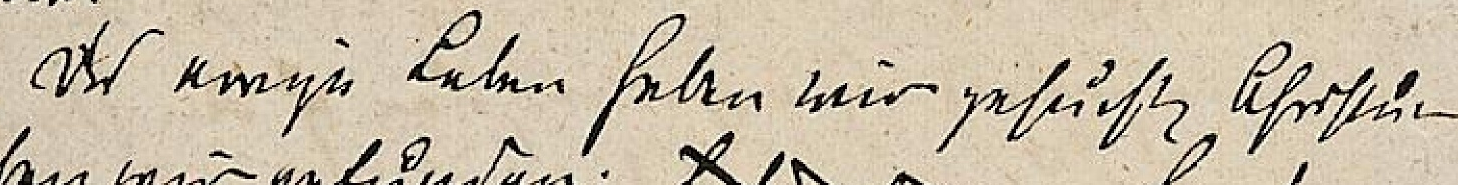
Das ewige Leben haben wir gesucht, Christum
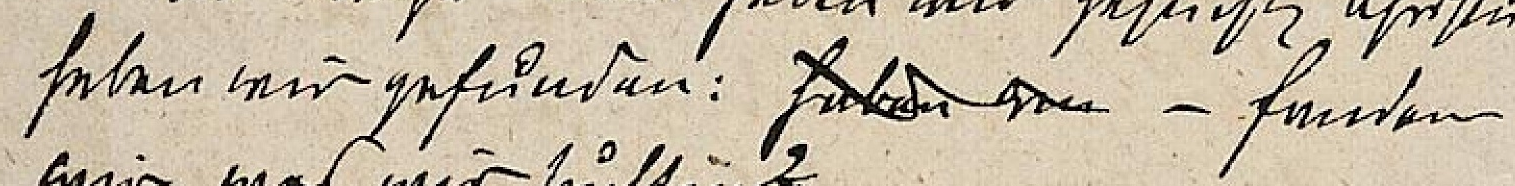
haben wir gefunden! habe von _ fanden
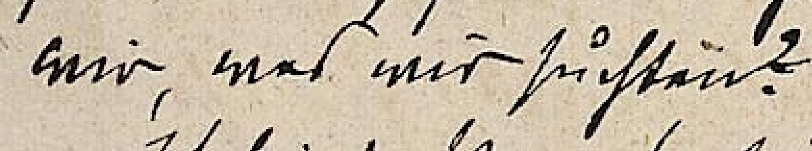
wir, was wir suchten?
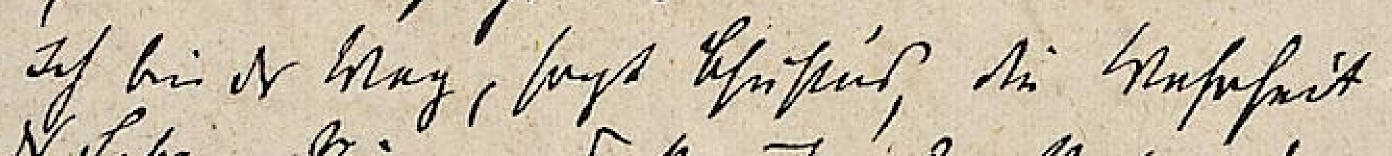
Ich bei dr Weg, sagt Chistus, die Wahrheit
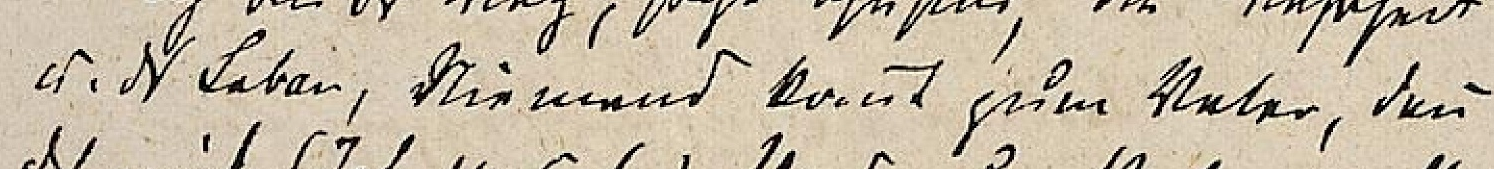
u. ds Leben, Niemand komt zum Vater, den
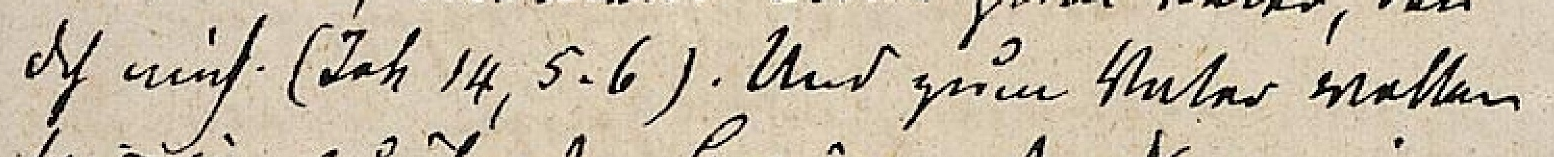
dch mich (Joh 14, 5.6). Und zum Vater wollen
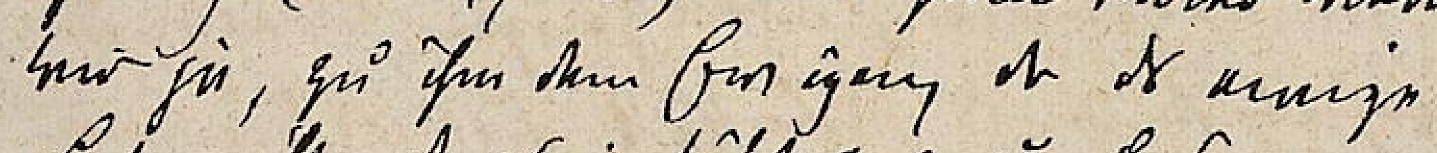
wir ja, zu ihm dem Ewigen, dr ds ewige
